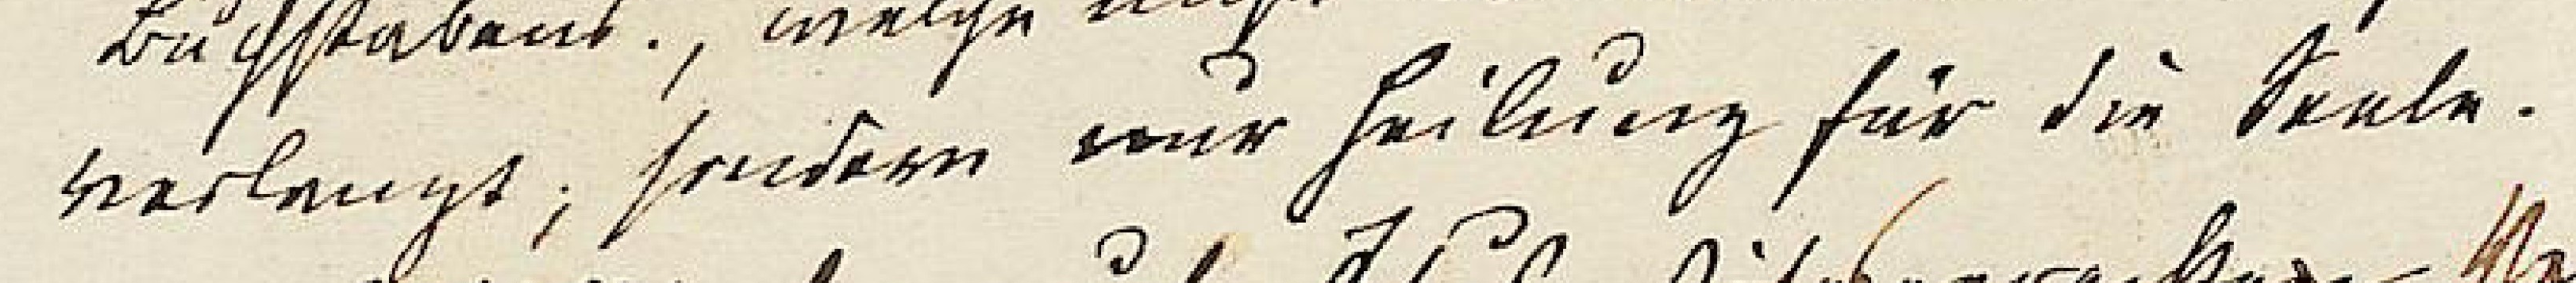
verlangt, sondern nur Heilung für die Seele.
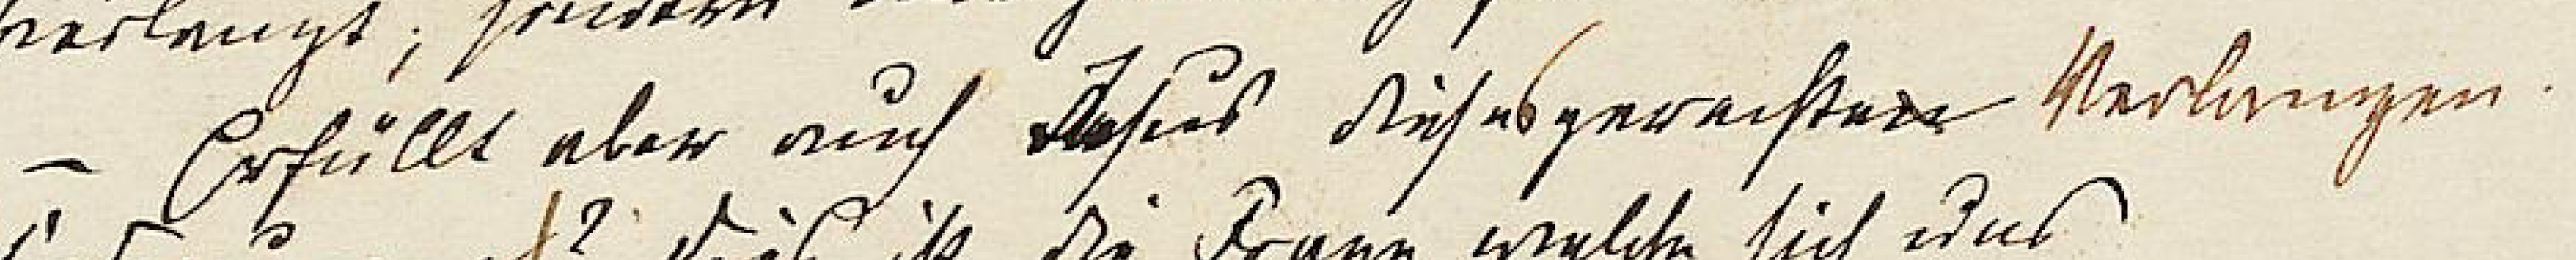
_Erfüllt aber auch Jeus dieses gerechte Verlangen
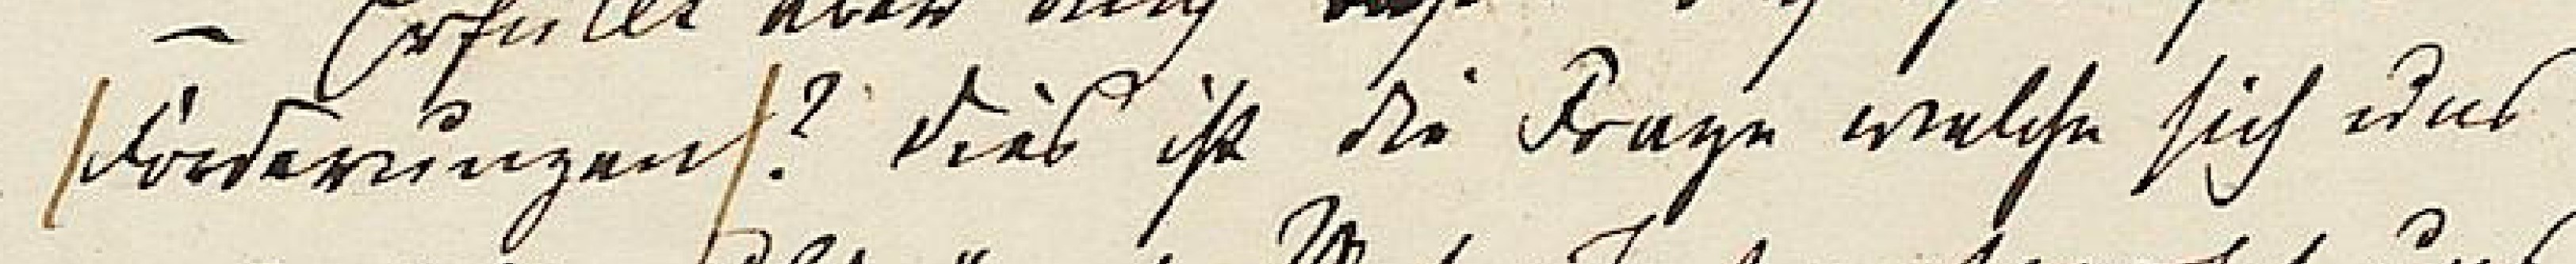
(Forderungen)? Dies ist die Frage welche sich uns
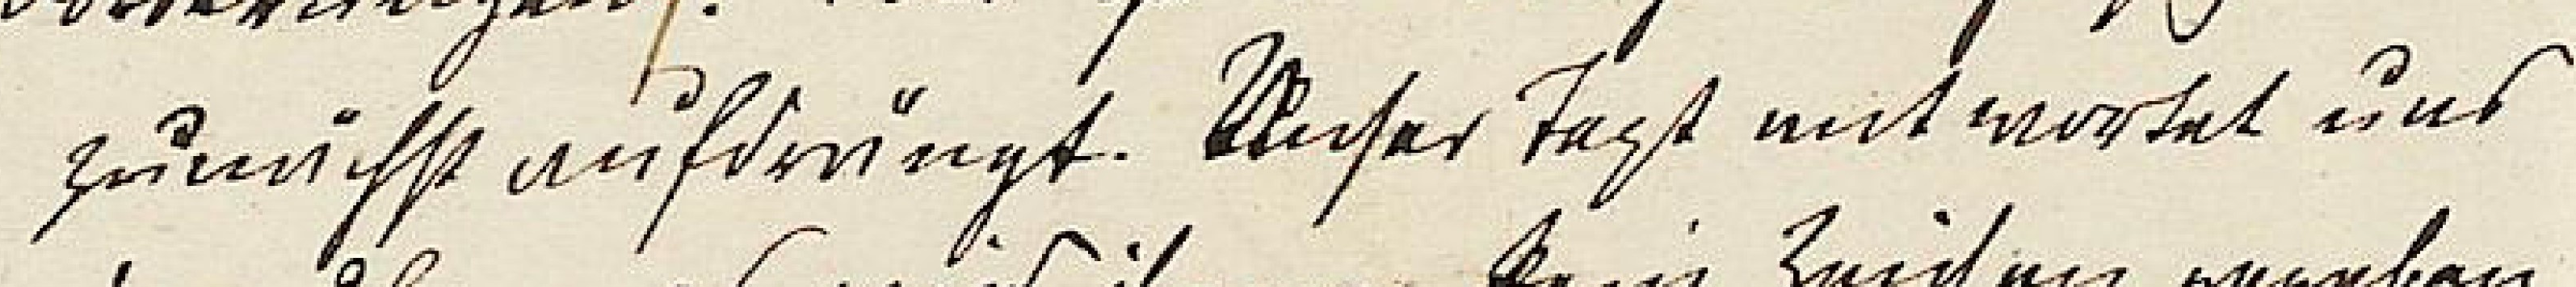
zunächst aufdrängt. Unser Text antwortet uns
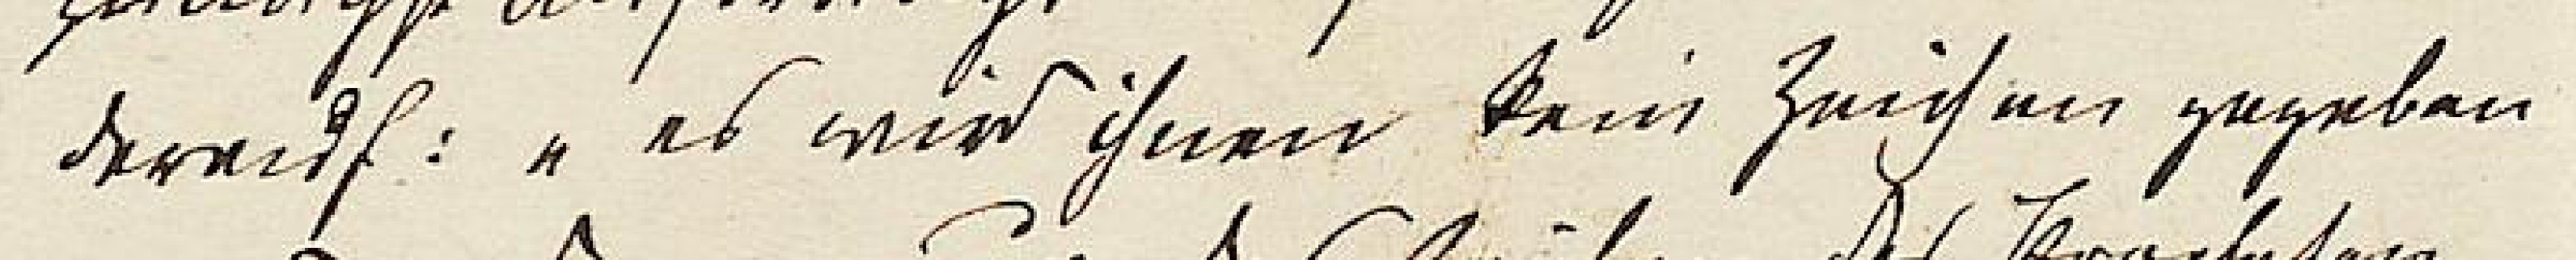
darauf: "es wird ihnen kein Zeichen gegeben
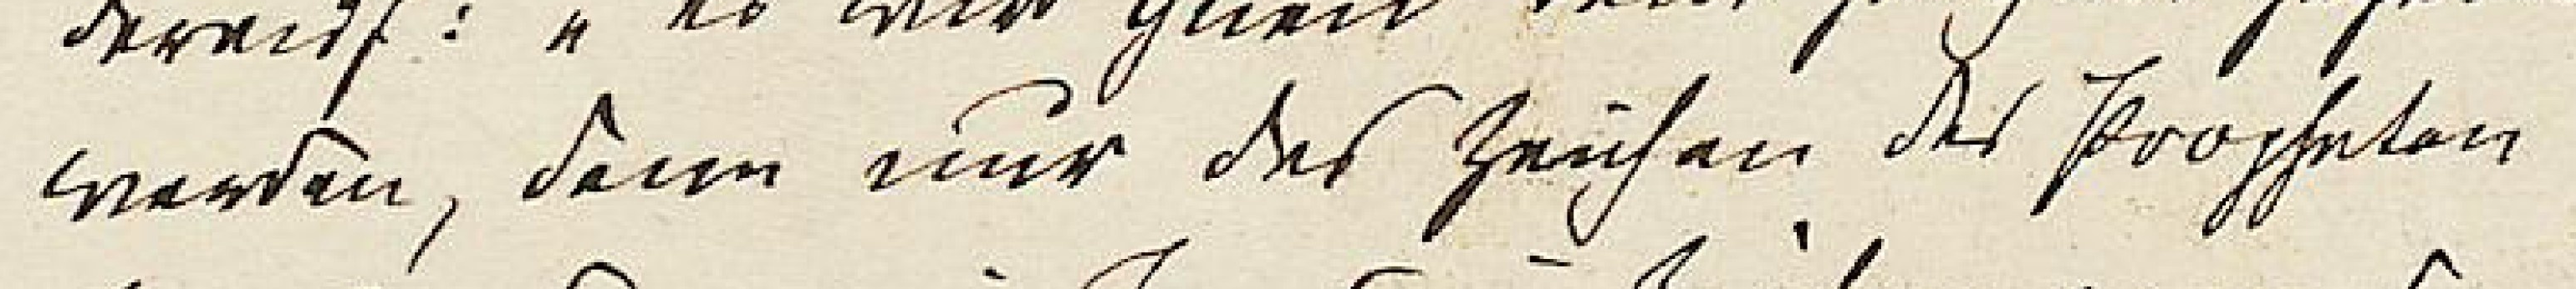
werden, denn nur das Zeichen des Propheten
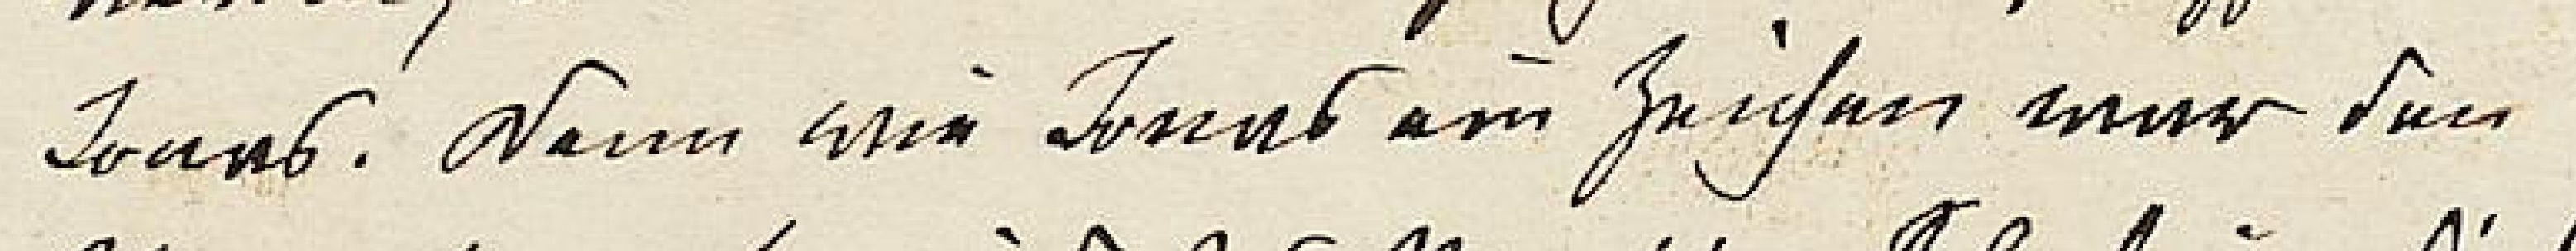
Jesus. Denn wie Jonas ein Zeichen war den
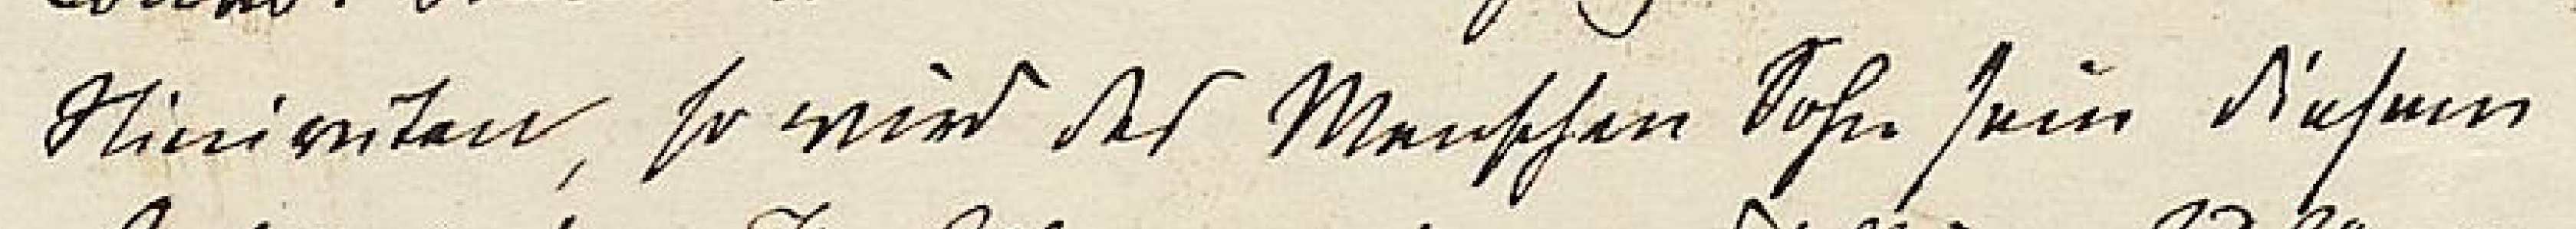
Niniviten, so wird des Menschen Sohn sein diesem
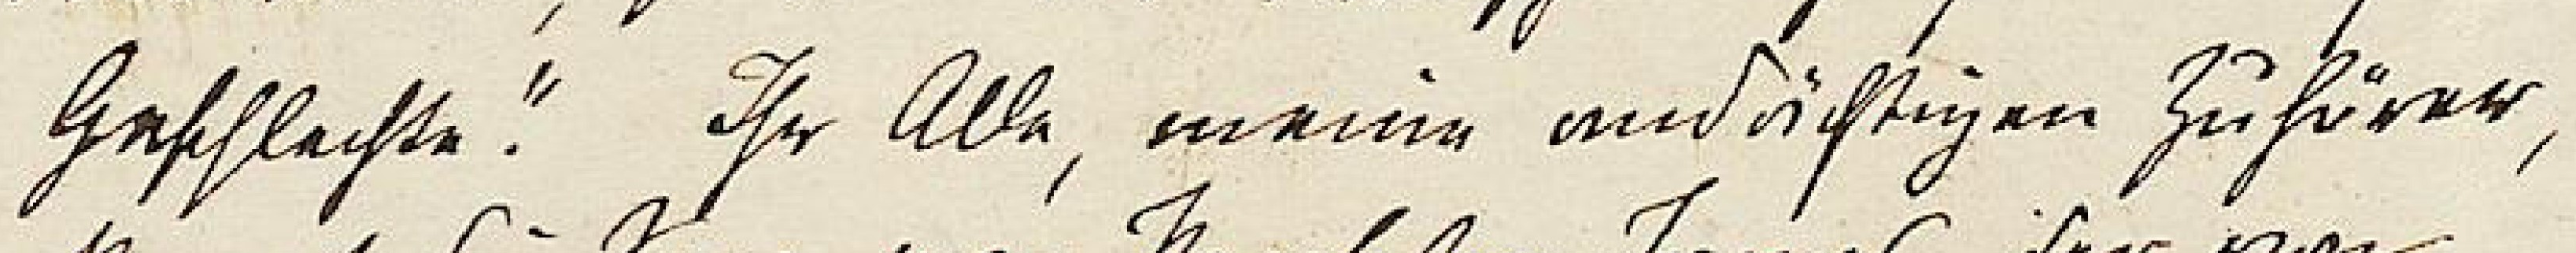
Geschlechte." Ihr Alle, meine andächtigen Zuhörer,
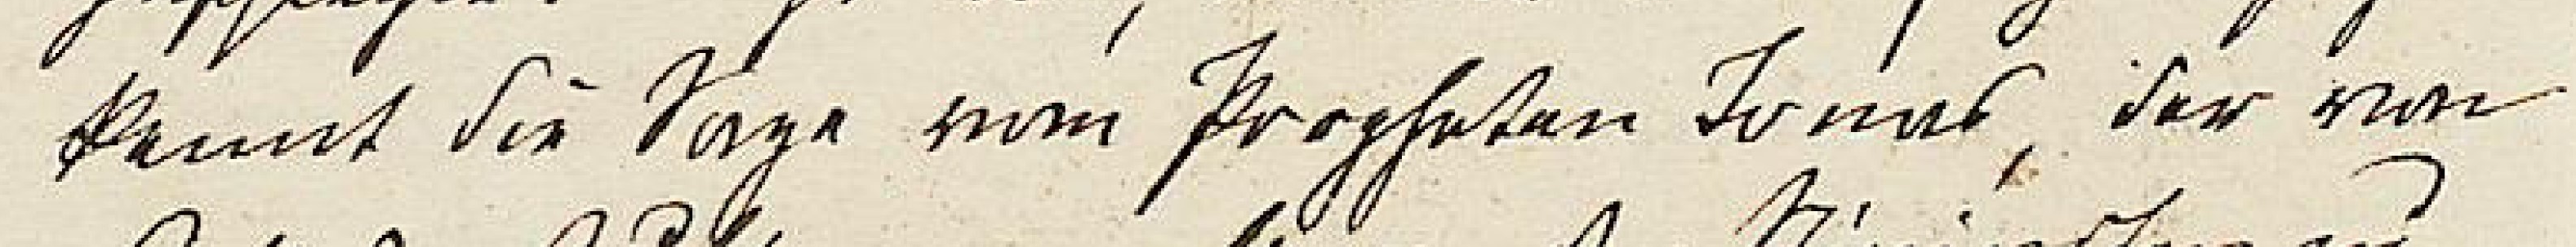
kennt die Sage vom Propheten Jonas, der von
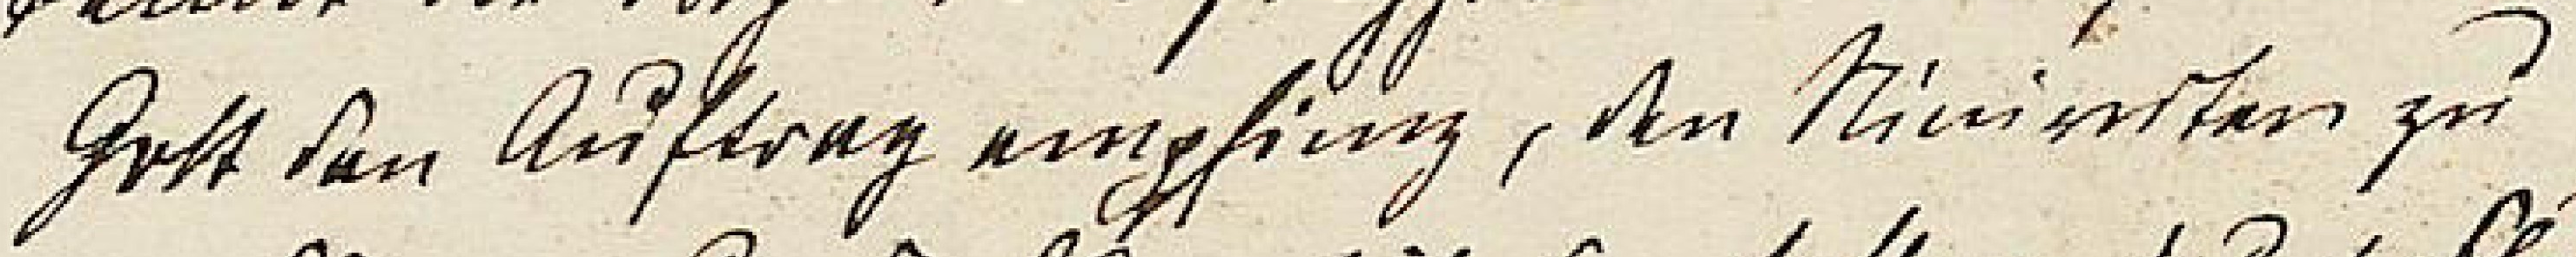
Gott dem Auftrag empfing, den Niniviten zu
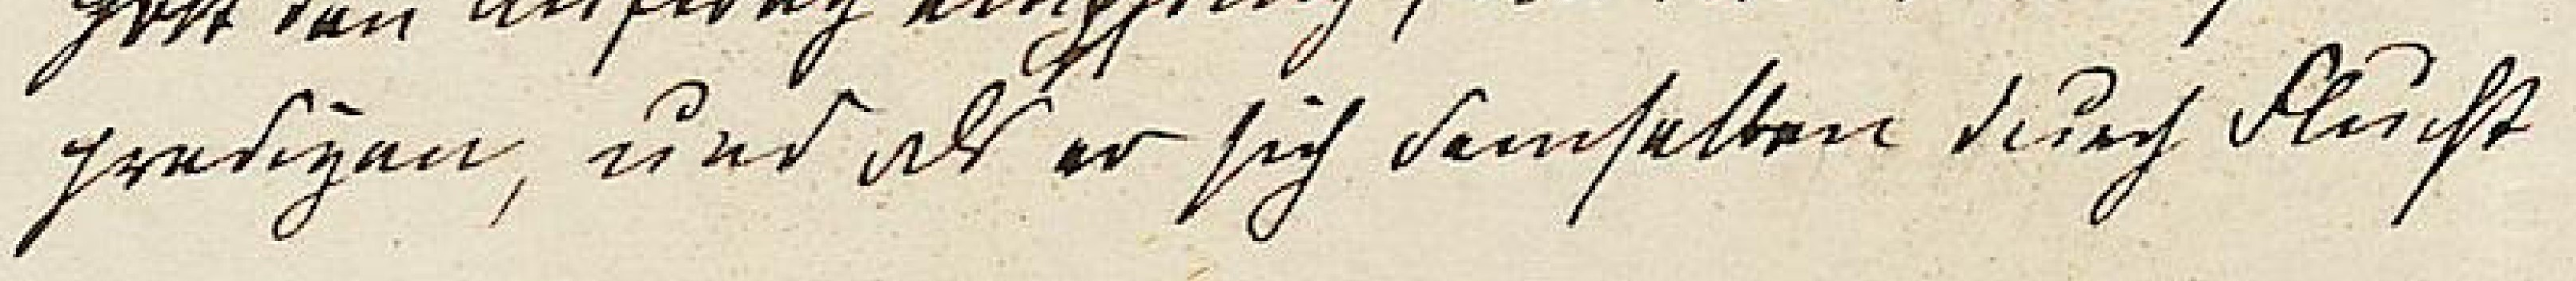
predigen, und all er sich densellen duch Flucht
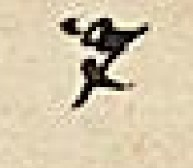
7.
